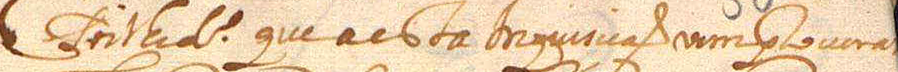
Foilhe d.o que a esta Inquisiçaõ vem procurar
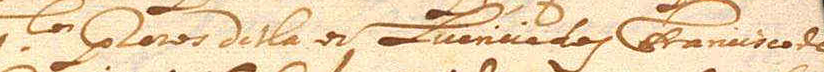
p.los prezos della os Licenciados Francisco de
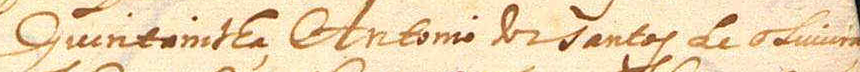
Quintanilha, Antonio dos santos de oLiveira,
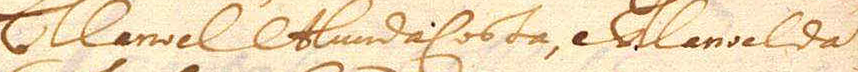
Manoel Alues da Costa, e Manoel da
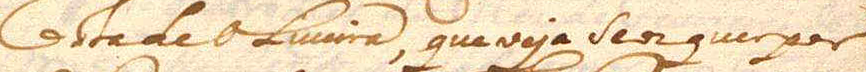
Costa de oLiueira, que veja se os quer por
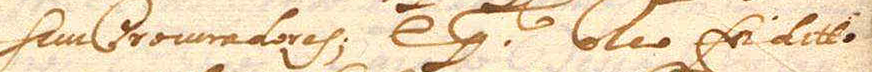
seus Procuradores; e p.lo Reo foi ditto
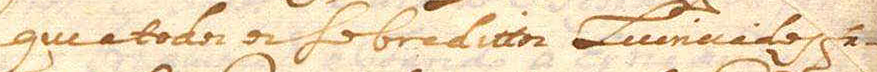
que a todos os sobredittos Licenciados fa
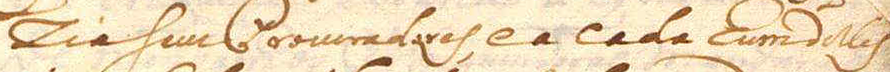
Zia seus Procuradores, e a cada hum delles
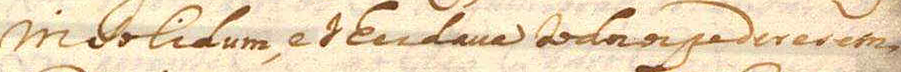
in solidum, e lhes daua todos os poderes em
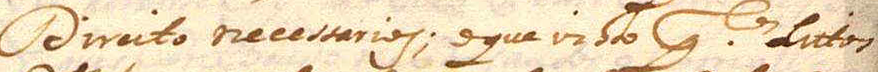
Direito necessarios; o que visto p.los dittos
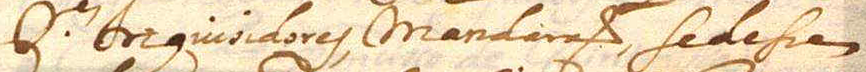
s.res Inquisidores, Mandaraõ, se desse
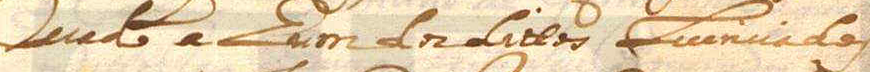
Recado a hum dos dittos Licenciados
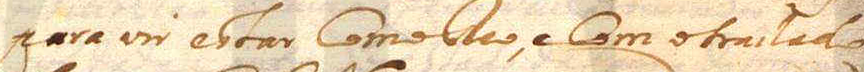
para vir estar Com o Reo, e Com o traslado
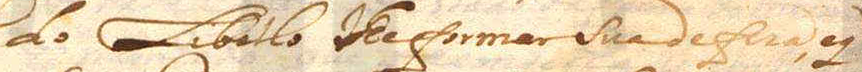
do Libello lhe formar sua defeza, e q̄
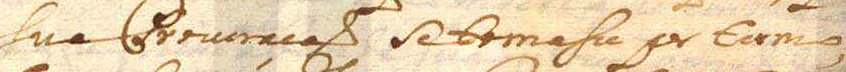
sua Procuraçaõ se tomasse por termo,
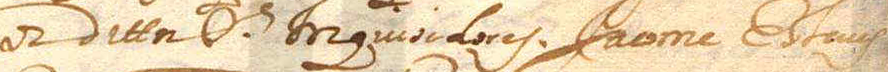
os dittos s.res Inquisidores. Jacome Esteues
